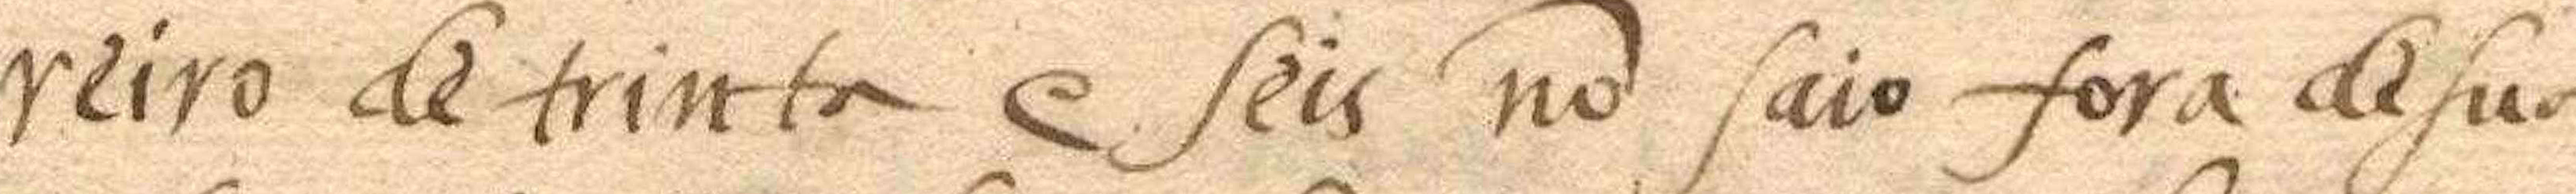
reiro de trinta e seis n̄o saio fora de sua
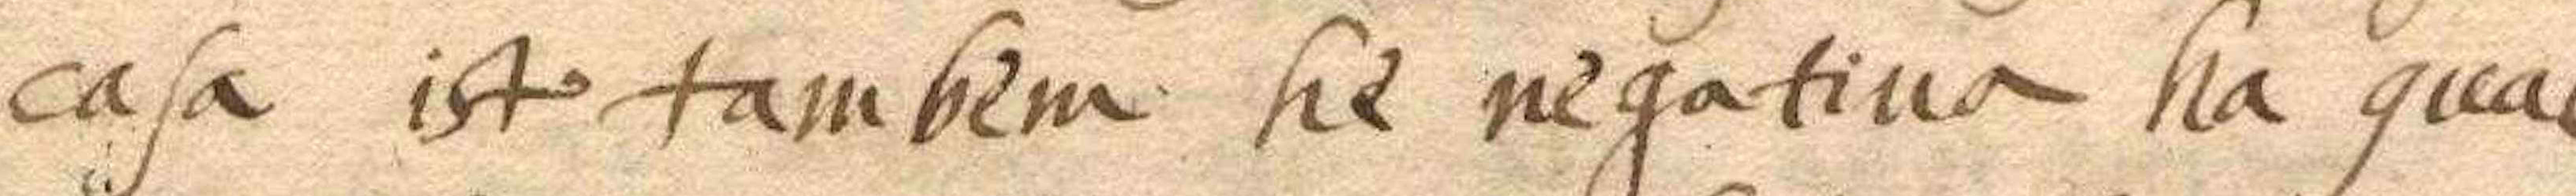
casa isto tambem he negatiua ha qual
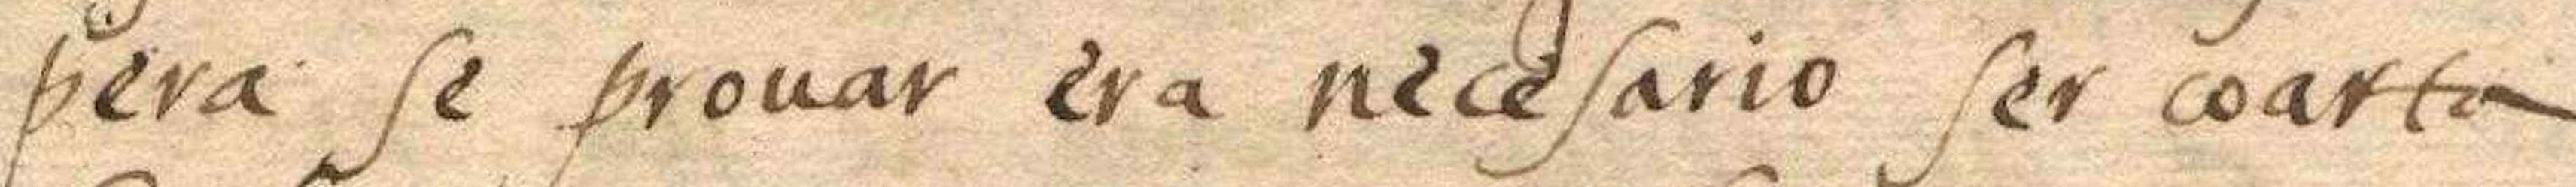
pera se prouar era necesario ser coarta
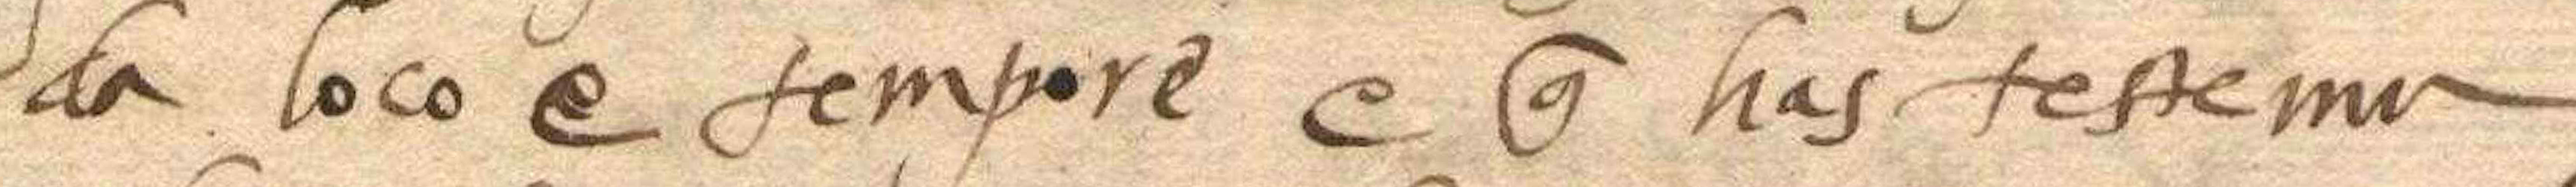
da loco e tempore e que has testemu
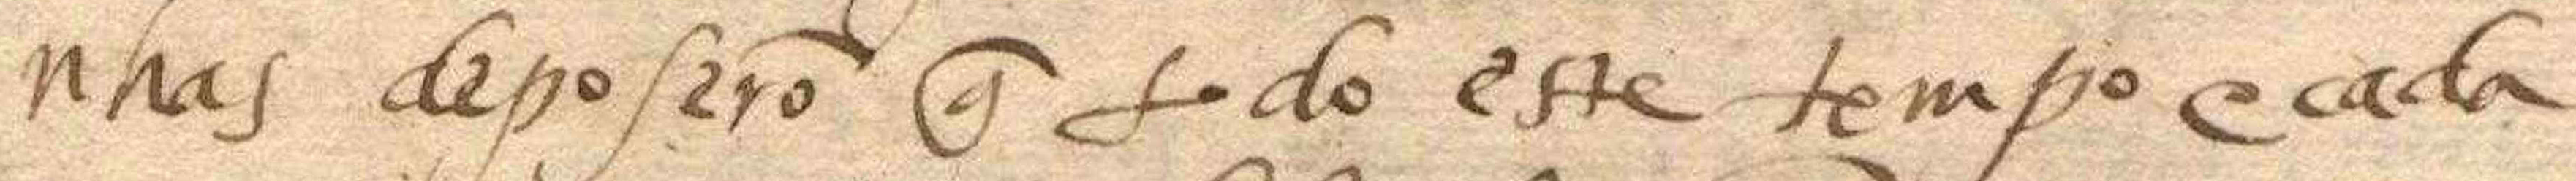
nhas deposer̄o q̄ todo este tempo e cada
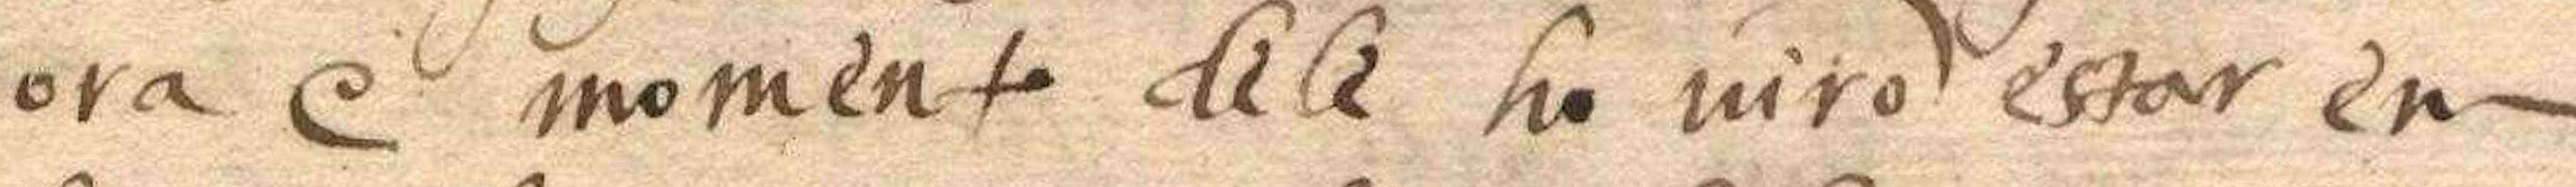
ora e momento dele ho uirō estar em
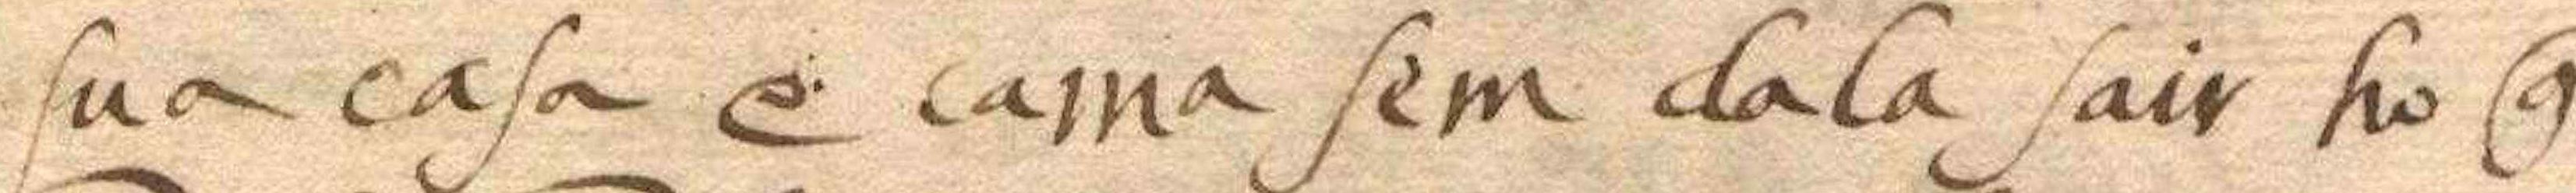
sua casa e cama sem dala sair ho q̄
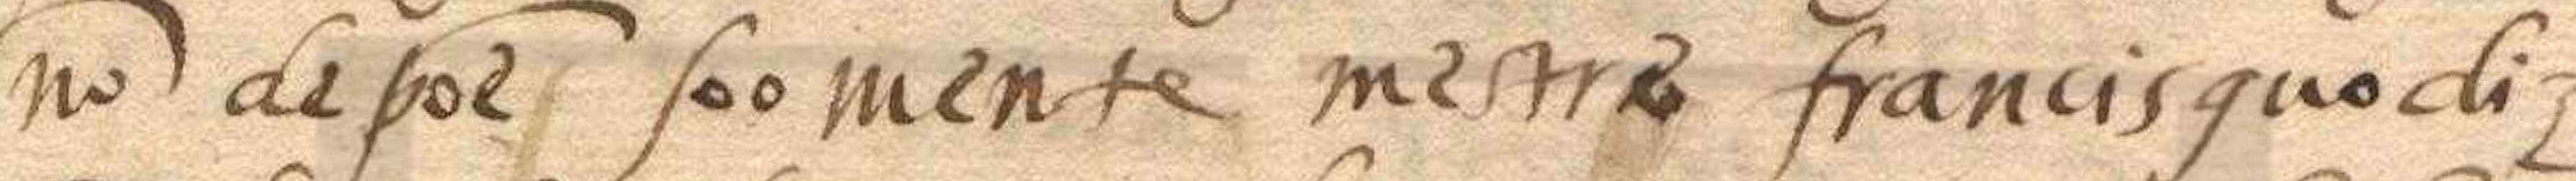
n̄o depõe soomente mestre francisquo diz
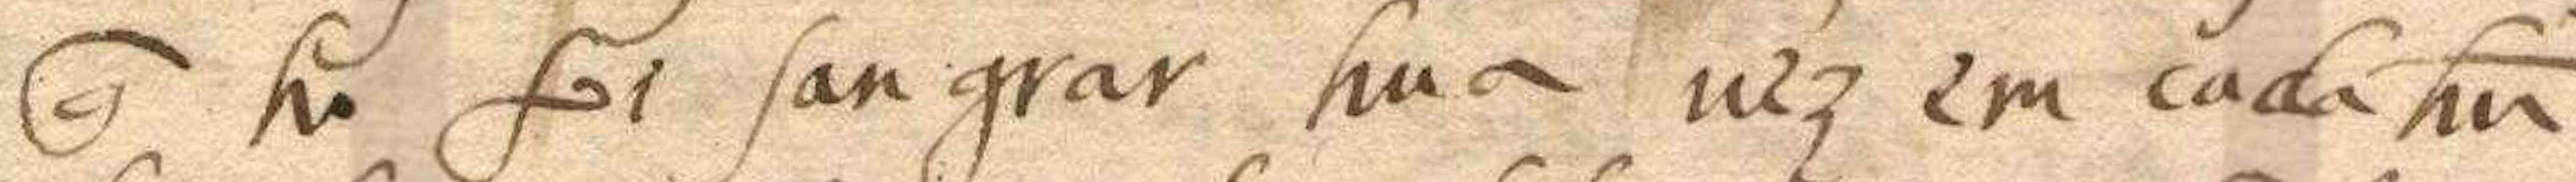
q̄ ho foi sangrar hua uez em cada hū
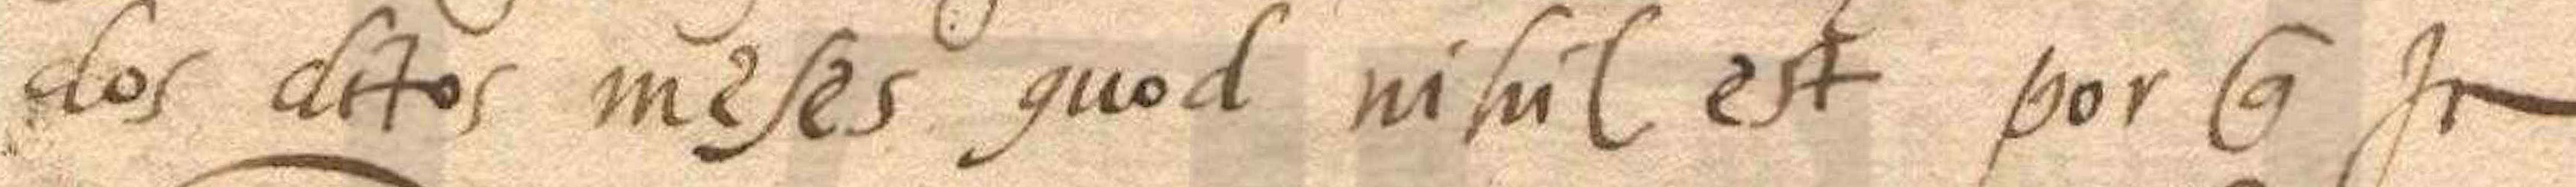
dos ditos meses quod nihil est por q̄ Ja
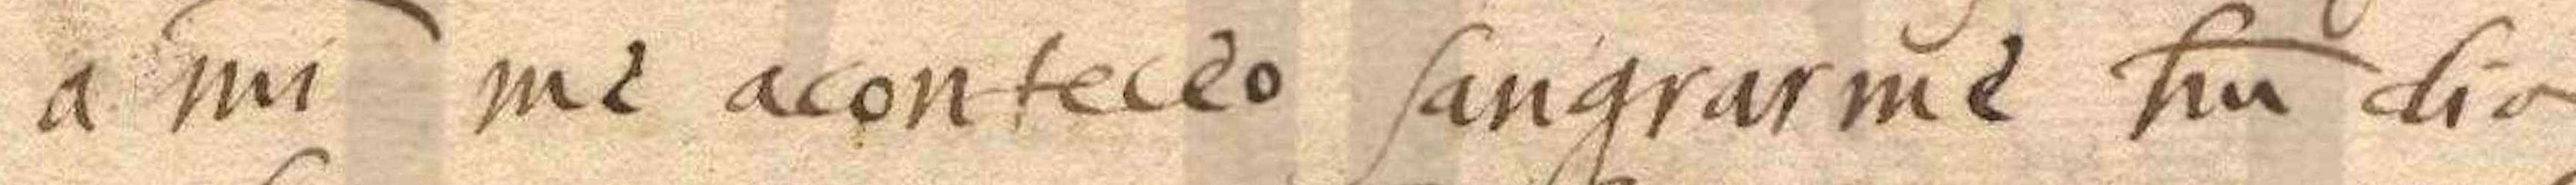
a m̄i me aconteceo sangrarme hū dia
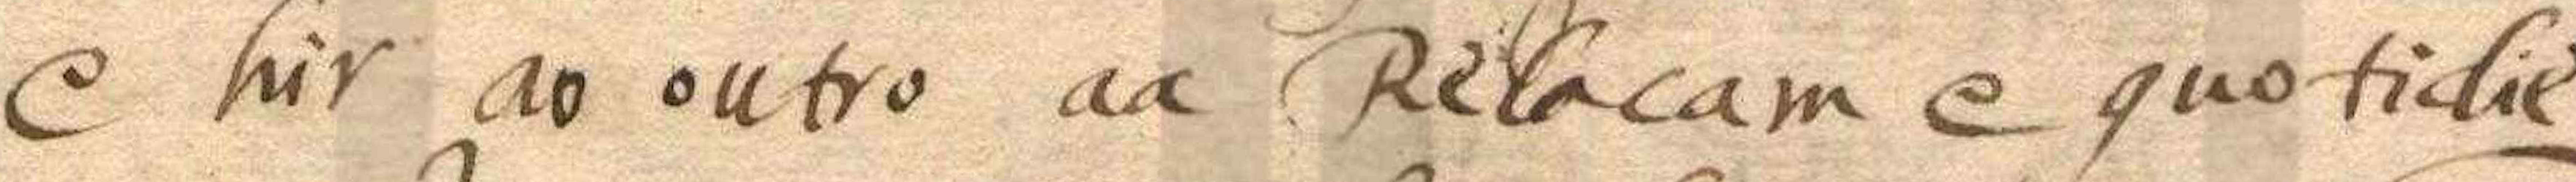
e hir ao outro aa Relacam e quotidie
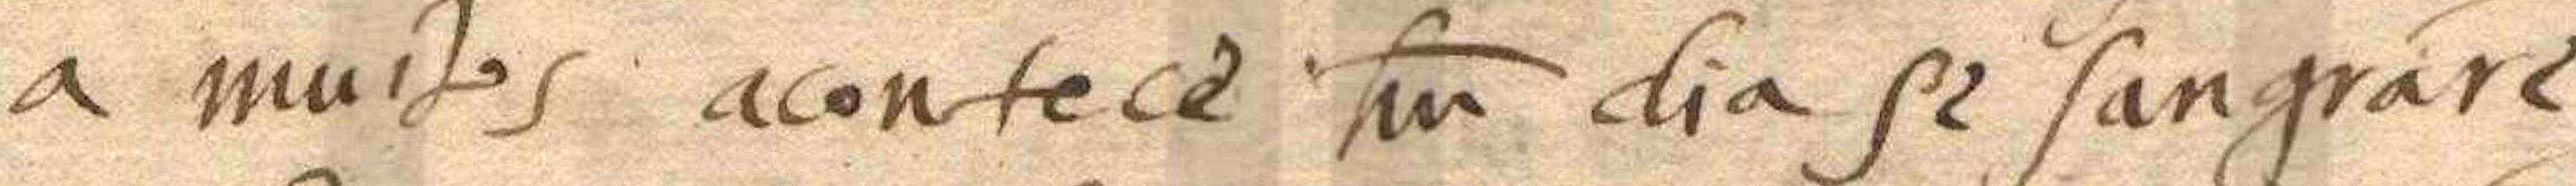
a muitos acontece hū dia se sangrar̄e
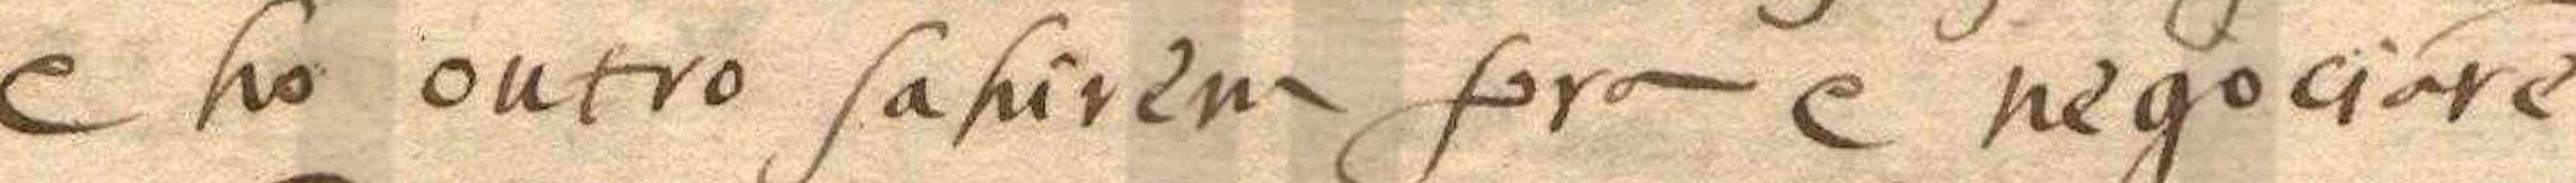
e o outro sahirem fora e negociar̄e
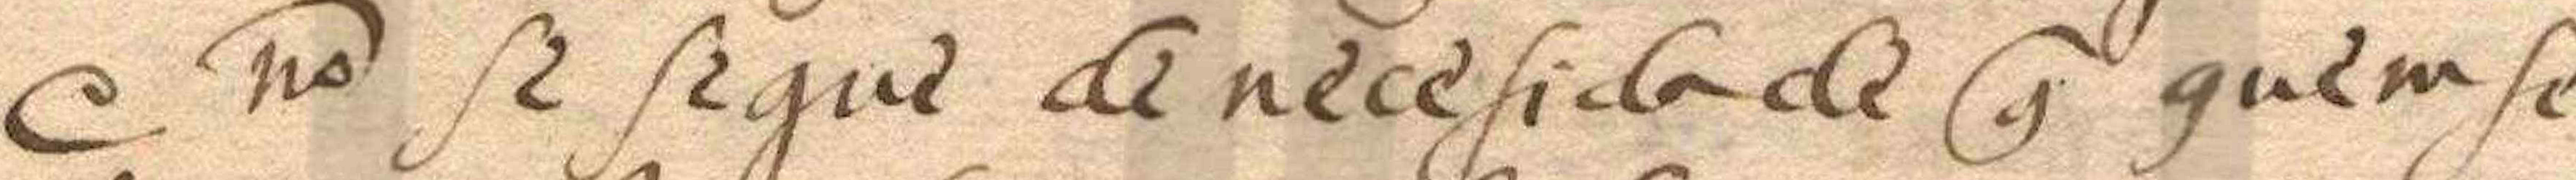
e n̄o se segue de necesidade q̄ quem se
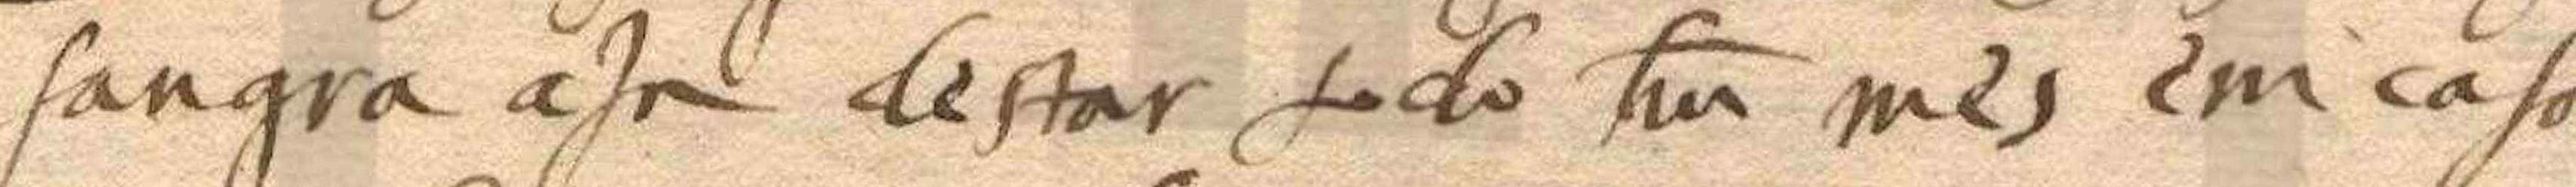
sangra aJa destar todo hū mes em casa
